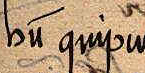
hū quipue
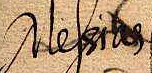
Messias
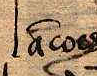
lācoes
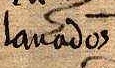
lauados
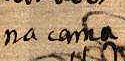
na cama
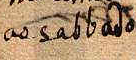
ao sabbado
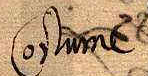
Costume
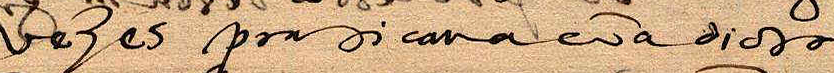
vezes praticaua cō a dicta
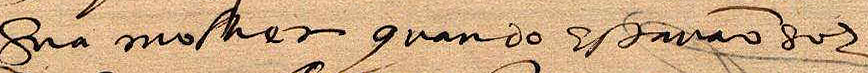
sua molher quando Estauaõ sos
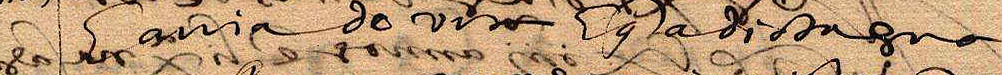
E auia de vir E q̄ a dicta sua
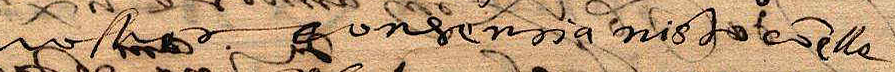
molher consentia nisto cō elle
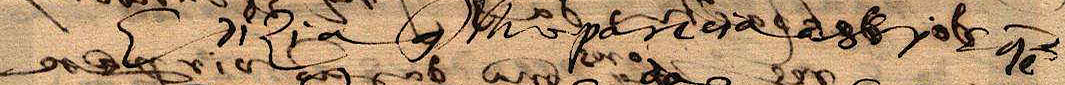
E dizia q̄ lho parecia assy E q̄ ē
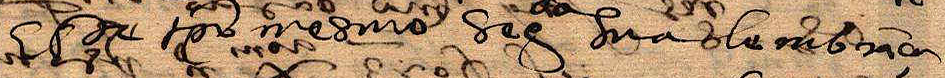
Este tpō mesmo segdo sua lembrāça
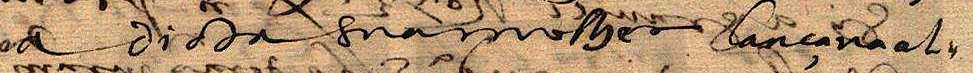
a dicta sua molher lançaua al
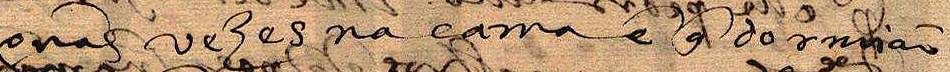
guās vezes na cama ē q̄ dormiaõ
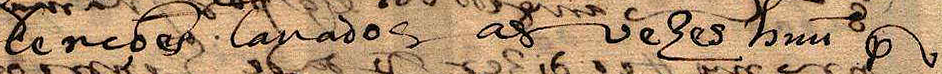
lençoēs lauados as vezes huū p̄o
